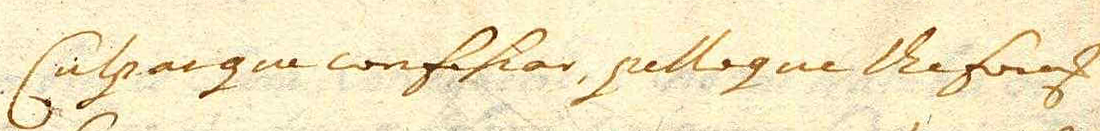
Culpas que confessar, pello que lhe foraõ
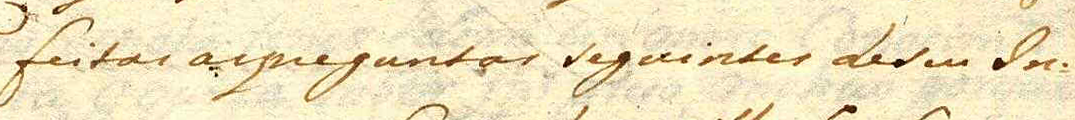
feitas as preguntas seguintes de seu In
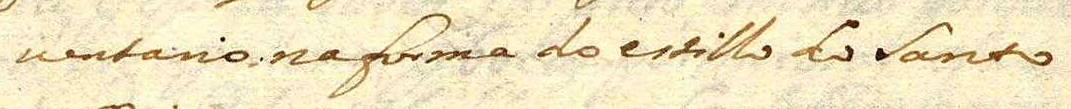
uentario na forma do estillo do Santo
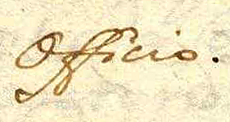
Officio.
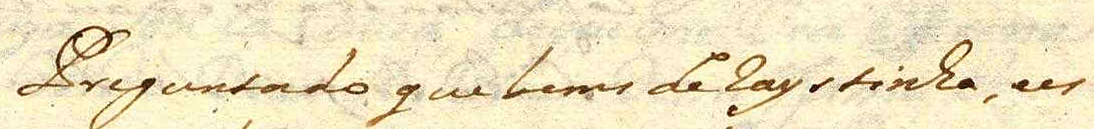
Preguntado que bems de Rays tinha, e es
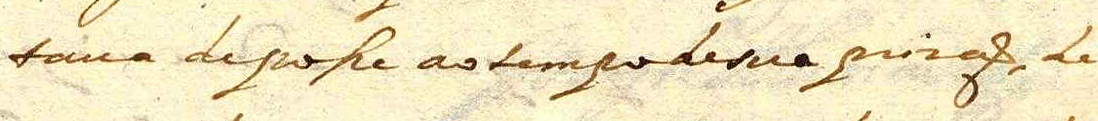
taua de posse ao tempo de sua prizaõ, de
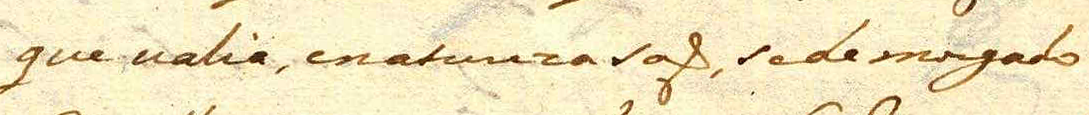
que ualia, e natureza saõ, se de morgado
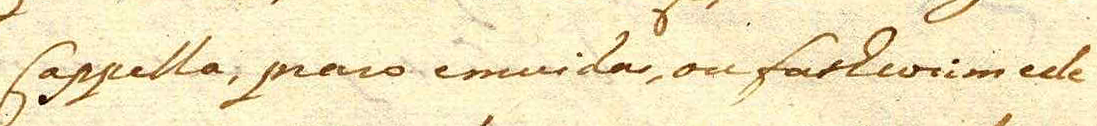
Cappella, prazo em uida, ou fatheosim ecle
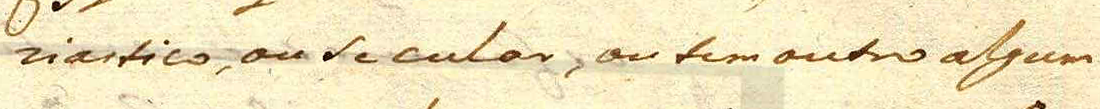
ziastico, ou secular, ou tem outro algum
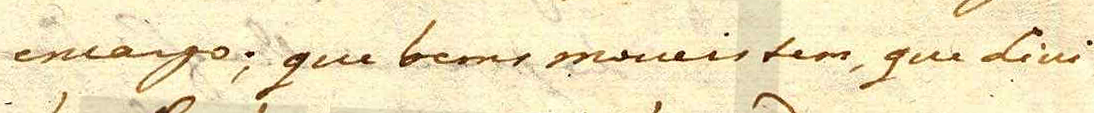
encargo; que bems moueis tem, que diui
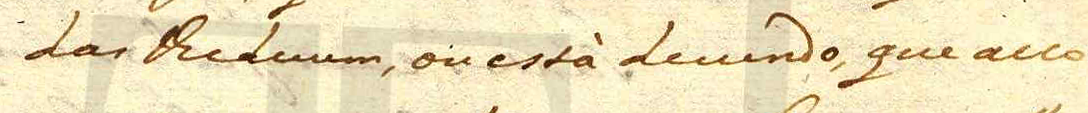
das lhe deuem, ou està deuendo, que acco
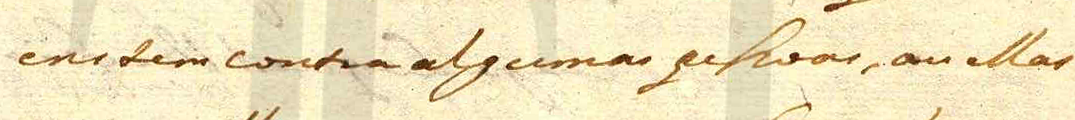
ens tem contra algumas pessoas, ou ellas
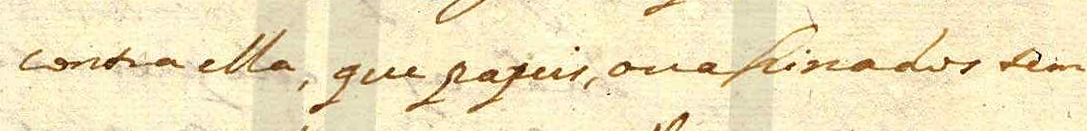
contra ella, que papeis, ou assinados tem
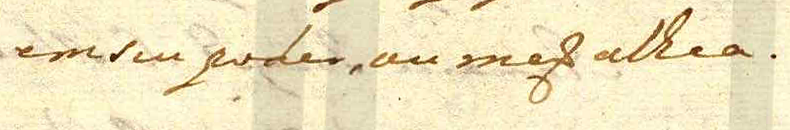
em seu poder, ou maõ alhea.
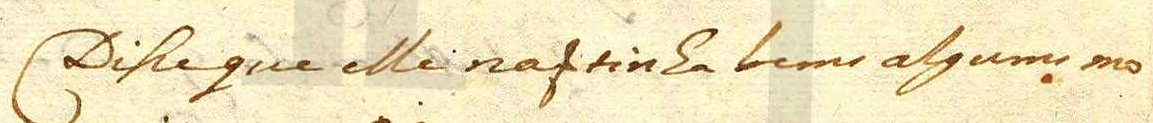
Disse que elle naõ tinha bems algums mo
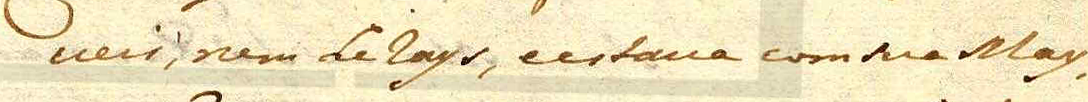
ueis, nem de Rays, e estaua com sua May,
